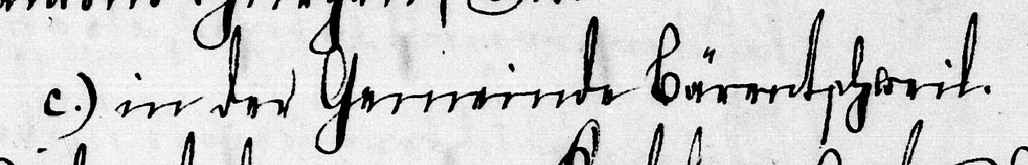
c.) in der Gemeinde Bärentschweil.
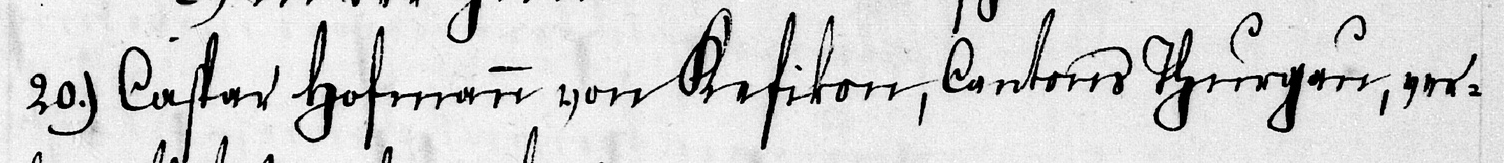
20.) Caspar Hofmann von Kefikon, Cantons Thurgau, ver¬
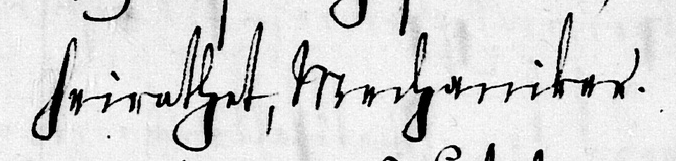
heirathet, Mechaniker.
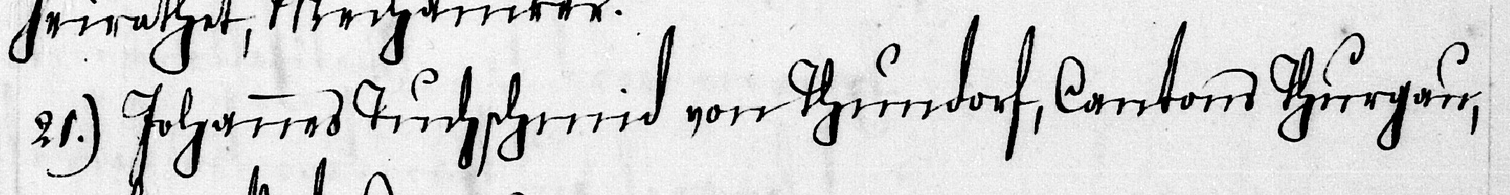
21.) Johannes Tuchschmid von Thundorf, Cantons Thurgau,
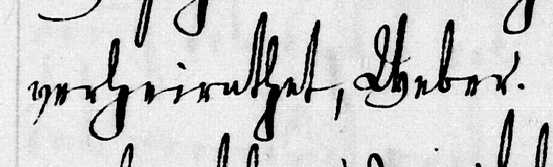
verheirathet, Weber.
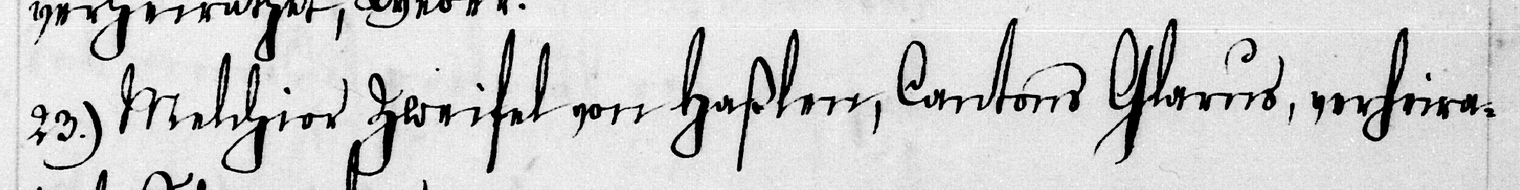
23.) Melchior Zweifel von Haßlen, Cantons Glarus, verheira¬
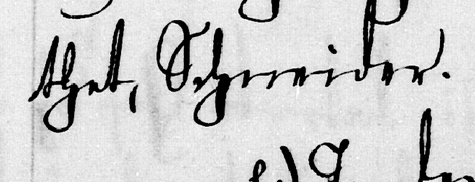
thet, Schneider.
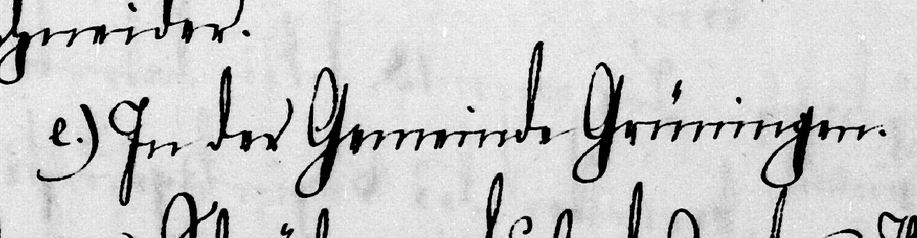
e.) In der Gemeinde Grüningen.
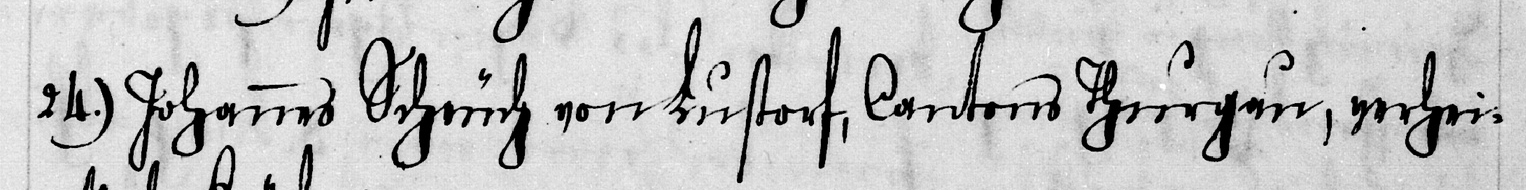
24.) Johannes Scheuch von Lustorf, Cantons Thurgau, verhei¬
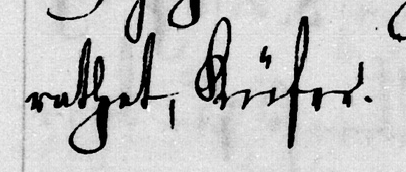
rathet, Küfer.
